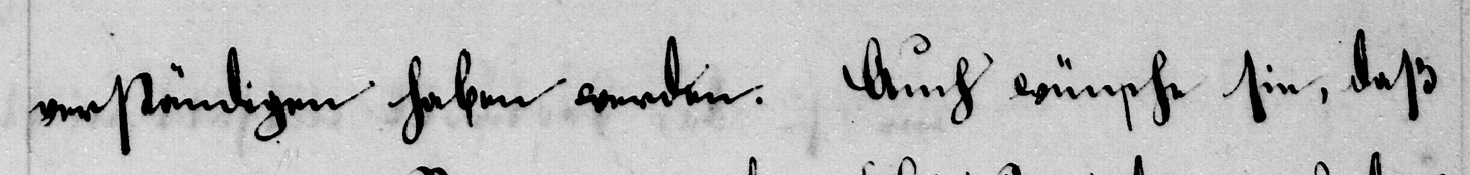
verständigen haben werden. Auch wünsche sie, daß
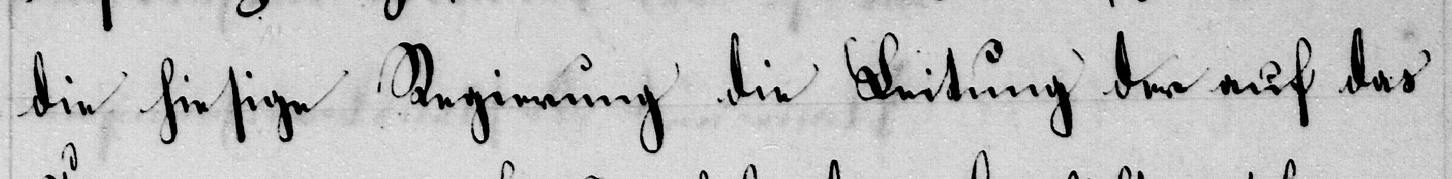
die hiesige Regierung die Leitung der auf das
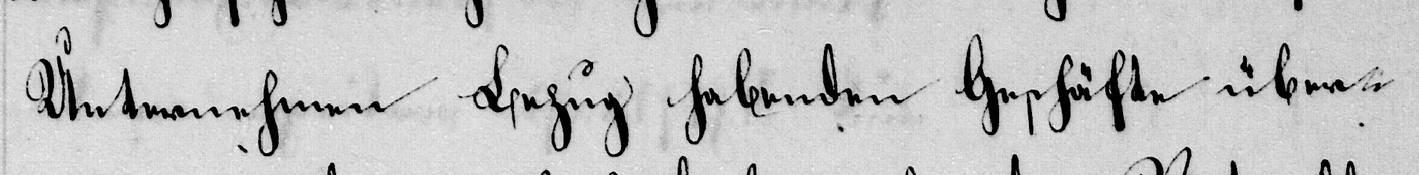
Unternehmen Bezug habenden Geschäfte über¬
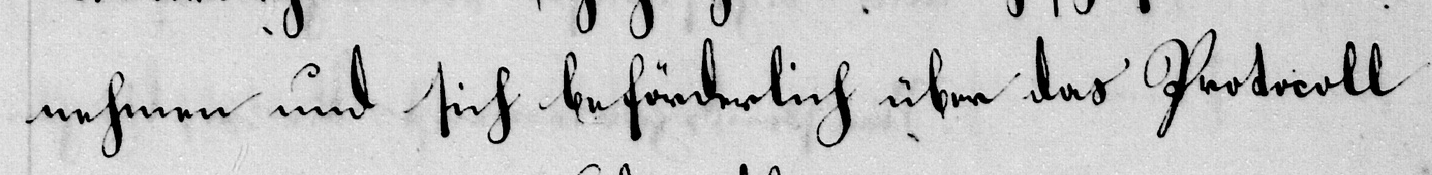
nehmen und sich beförderlich über das Protocoll
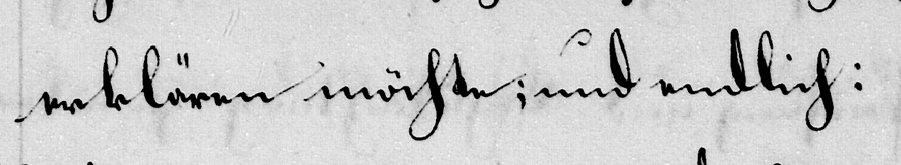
erklären möchte; und endlich:
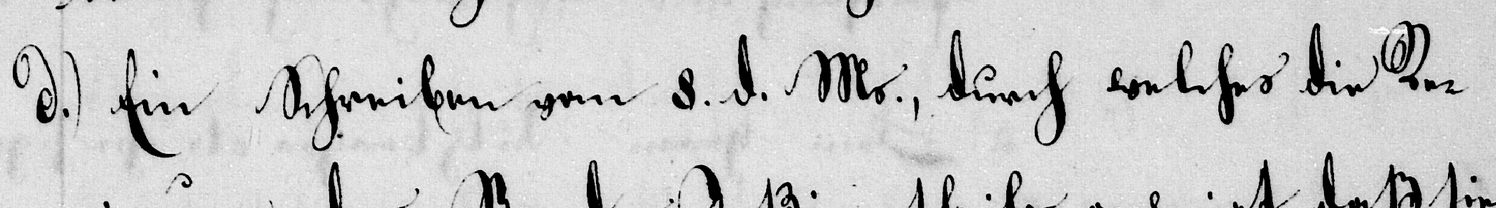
d.) Ein Schreiben vom 8. d. Ms., durch welches die Re¬
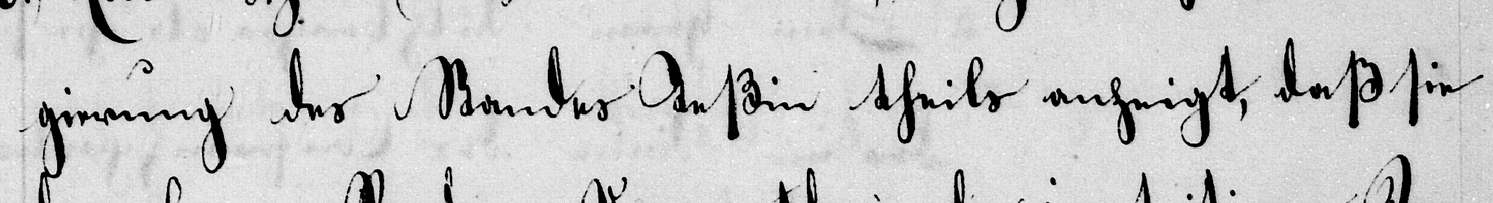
gierung des Standes Teßin theils anzeigt, daß sie
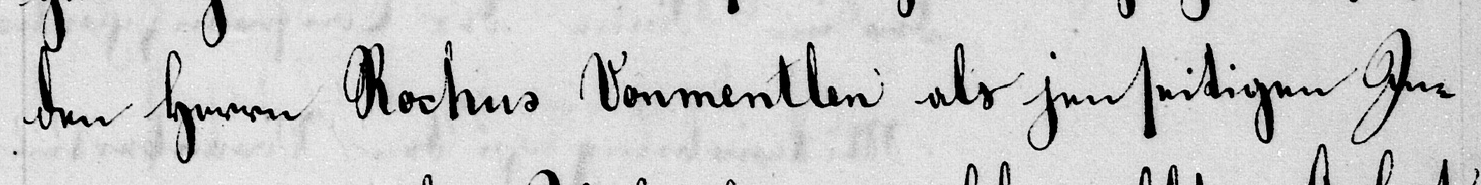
den Herrn Rochus Vonmentlen als jenseitigen In¬
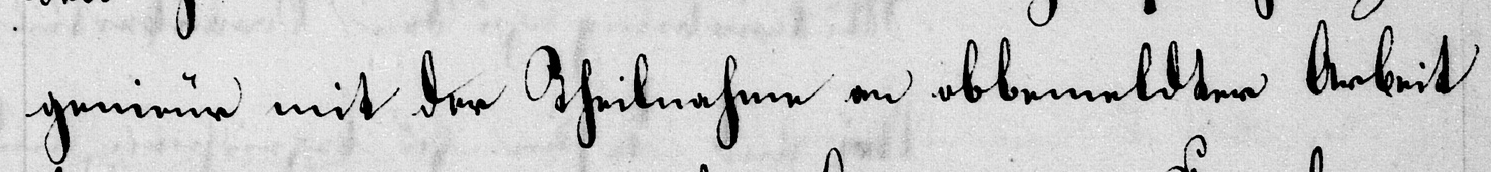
genieur mit der Theilnahme an obbemeldter Arbeit
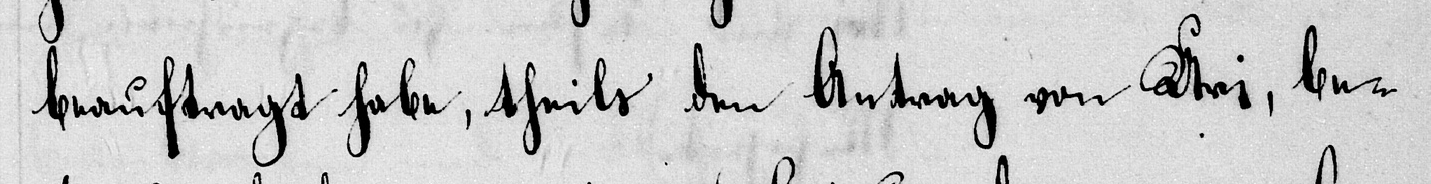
beauftragt habe, theils den Antrag von Uri, be¬
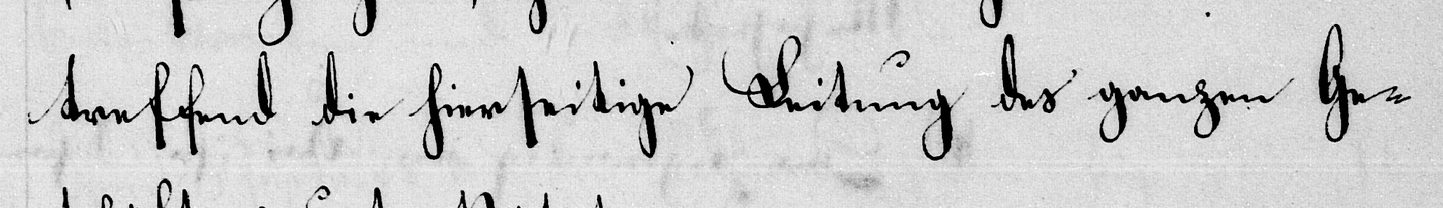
treffend die hierseitige Leitung des ganzen Ge¬
